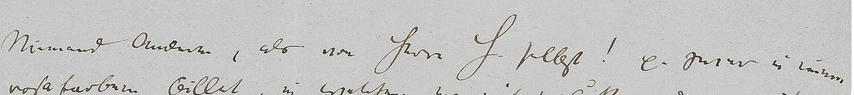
Niemand Anderm, als von Herrn H. selbst! &. zwar in einem
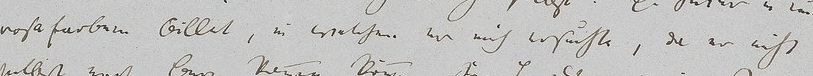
rosafarbnen Billet, in welchem er mich ersuchte, da er nicht
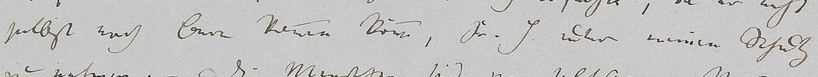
selbst nach Bern kommen könne, Fr. H. unter meinen Schutz
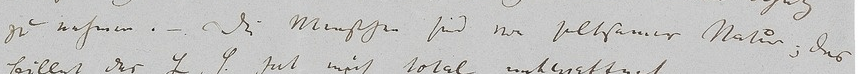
zu nehmen. – Die Menschen sind von seltsamer Natur; das
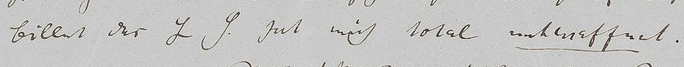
Billet des Herrn H. hat mich total entwaffnet.
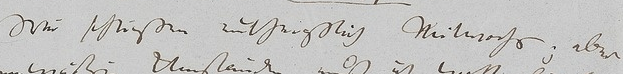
Wir schließen muthmaßlich Mitwochs; aber
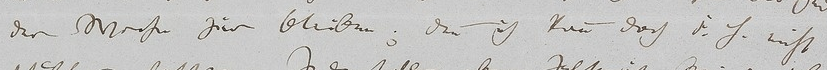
der Woche hier bleiben; denn ich kann doch F. H. nicht
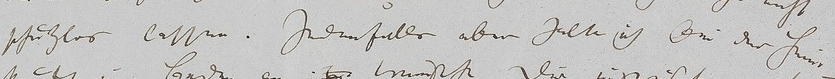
schutzlos lassen. Jedenfalls aber halte ich bei der Heim-
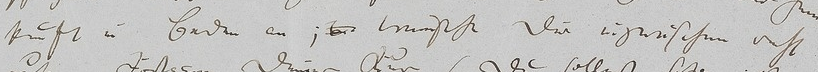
kunft in Baden an; &. wünsche Dir inzwischen recht
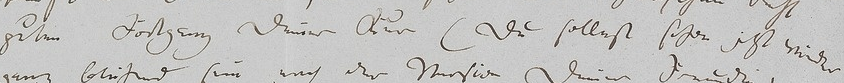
guten Fortgang Deiner Kur (Du sollest schon jetzt wieder
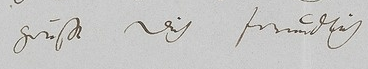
grüße Dich freundlich
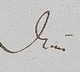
Dein
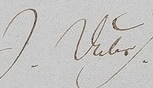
J. Dubs.
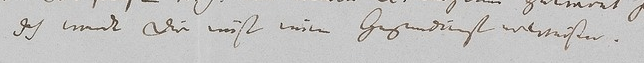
Ich werde Dir einst einen Gegendienst erweisen.
